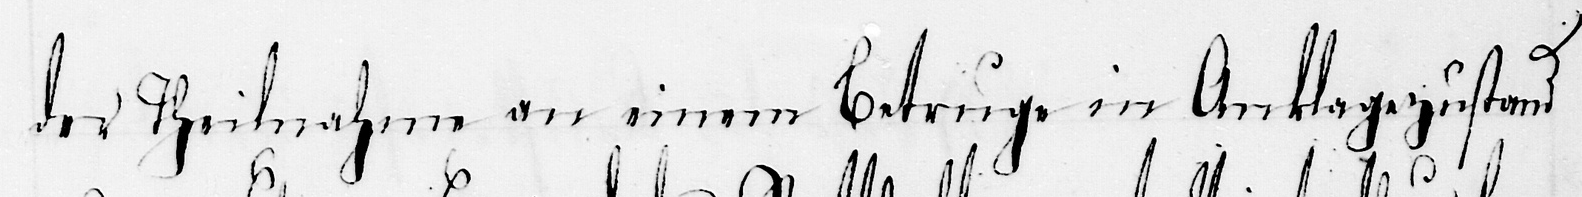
der Theilnahme an einem Betruge in Anklagezustand
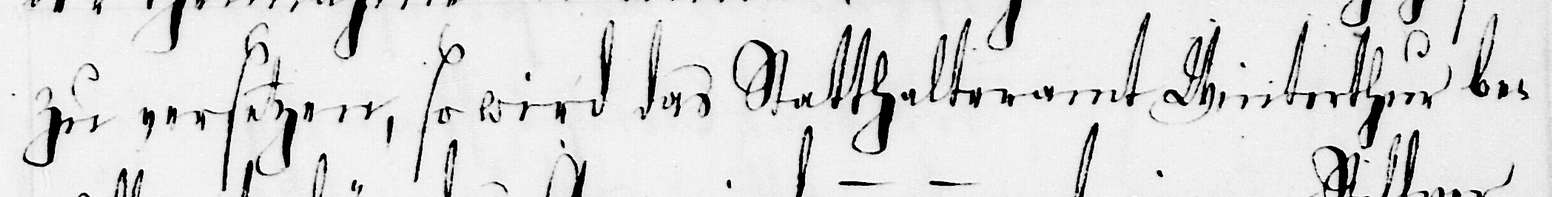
zu versetzen, so wird das Statthalteramt Winterthur be¬
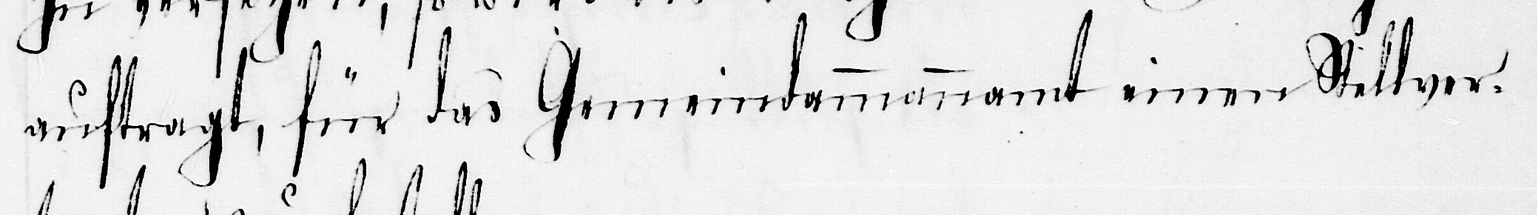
auftragt, für das Gemeindammannamt einen Stellver¬
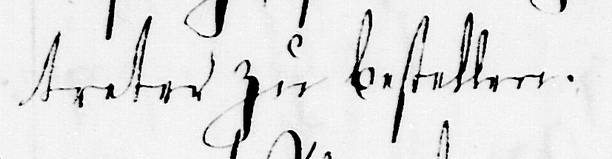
treter zu bestellen.
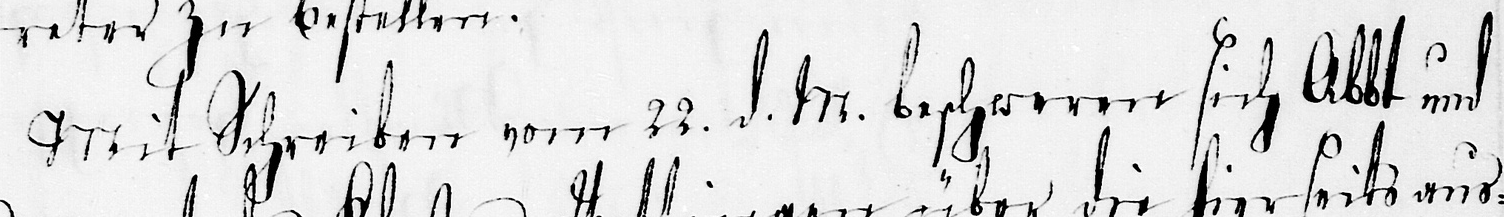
Mit Schreiben vom 22. d. M. beschweren sich Abbt und
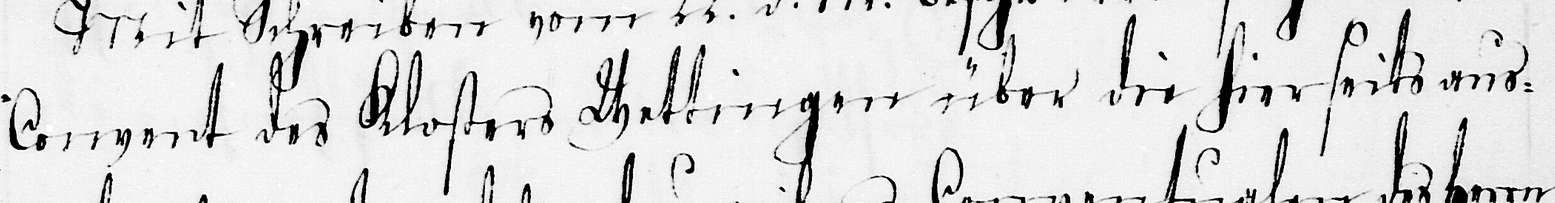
Convent des Klosters Wettingen über die hierseits aus¬
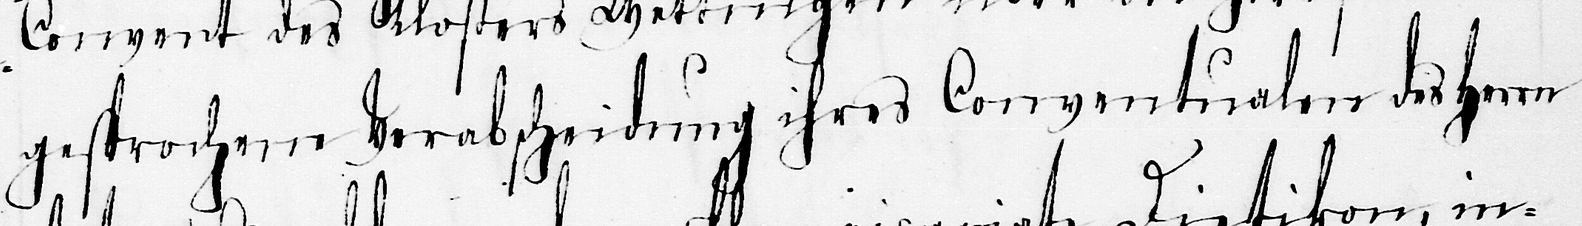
gesprochene Verabscheidung ihres Conventualen des Herrn
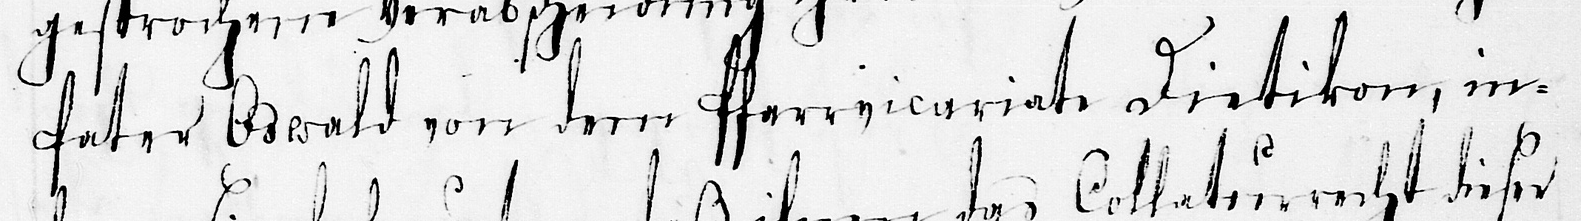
Pater Oswald von dem Pfarrvicariate Dietikon, in¬
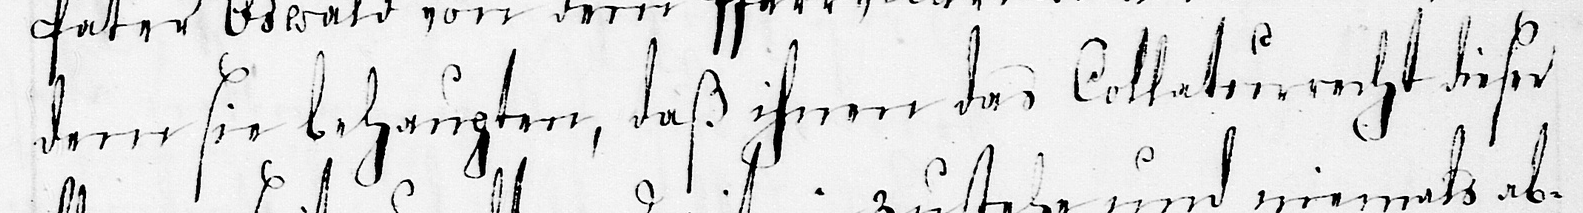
dem sie behaupten, daß ihnen das Collaturrecht dieser
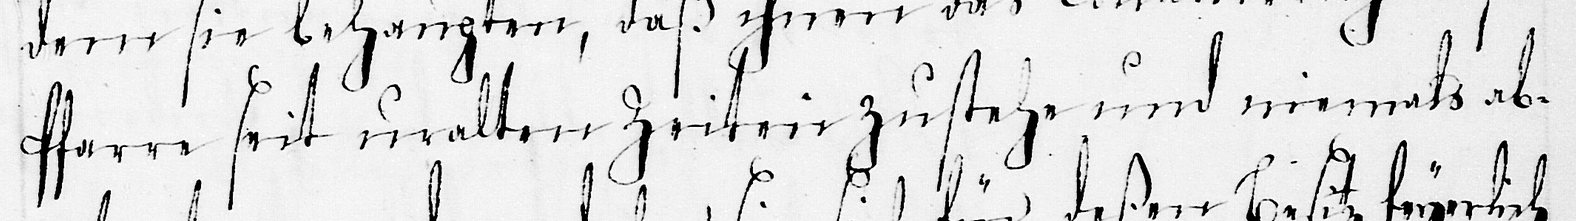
Pfarre seit uralten Zeiten zustehe und niemals ab¬
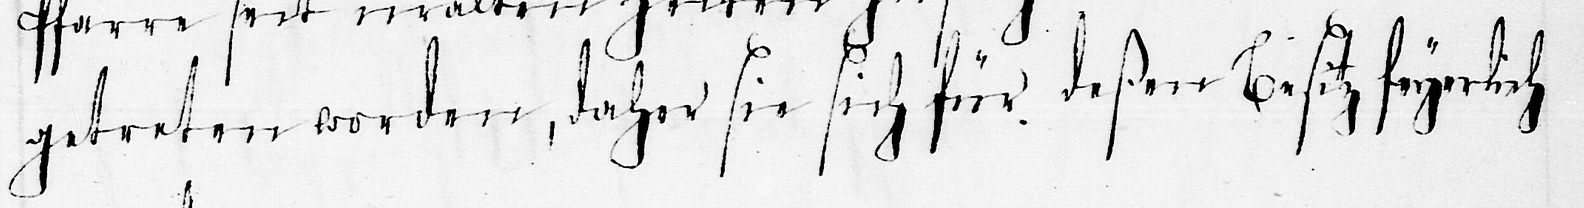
getreten worden, daher sie sich für deßen Besitz feyerlich
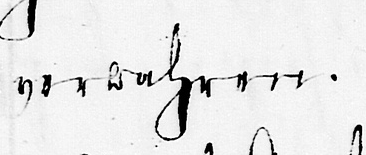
verwahren.
